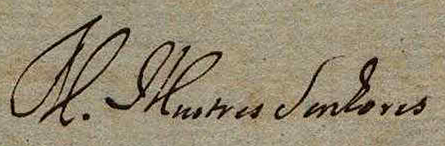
M. Illustres Senhores
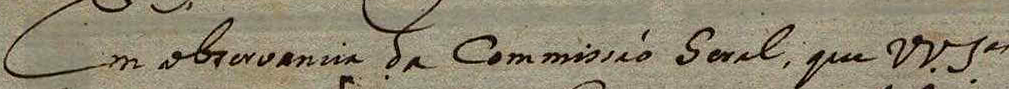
Em observancia da Commissaõ Geral, que V V. S.as
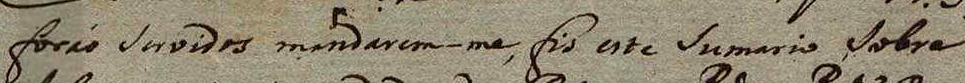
foraõ servidos mandarem-me, fiz este Sumario Sobre
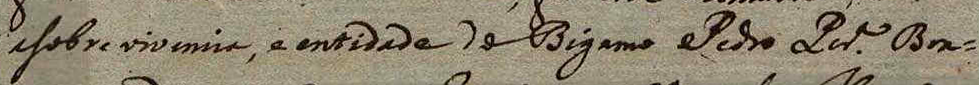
a sobrevivencia, e entidade do Bigamo Pedro Per.a Bra
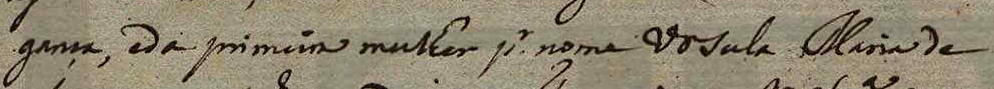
gança, e da primeira mulher p.r nome Vrsula Maria de
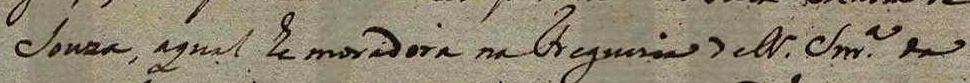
Souza, a qual he moradora na Freguesia de N. Snr.a da
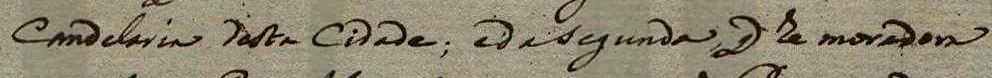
Candelaria desta Cidade; e da segunda, q̄ he moradora
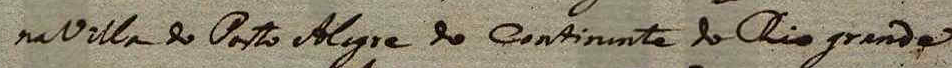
na Villa do Porto Alegre do Continente do Rio grande
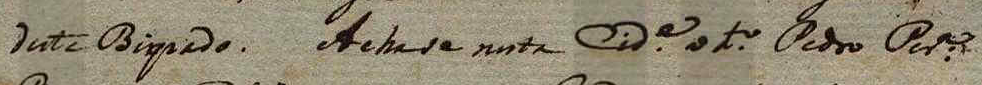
deste Bispado. Achase nesta Cid.e o d̄.o Pedro Per.a
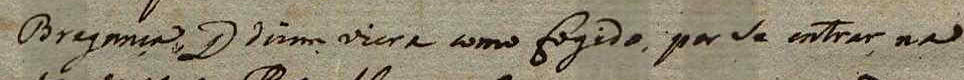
Bragança, q̄ dizem viera como fogido, por se entrar na
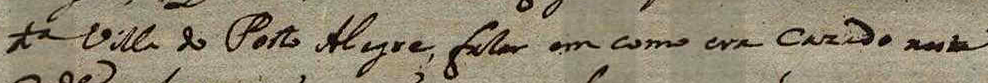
d̄.a Villa do Porto Alegre, falar em como era cazado nesta
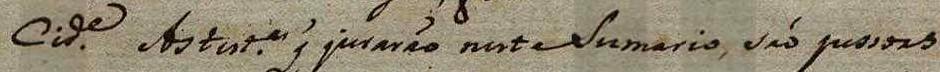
Cid.e As test.as q̄ juraraõ neste Sumario, saõ pessoas
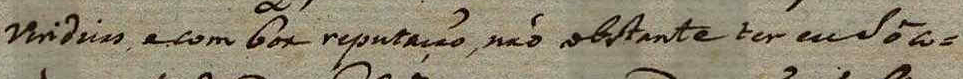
veridicas, e com boa reputaçaõ, naõ obstante ter eu Só co
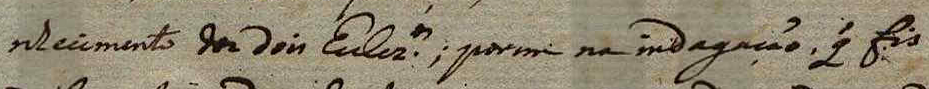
nhecimento dos dois Ecclez.os; porem na indagaçaõ, q̄ fis
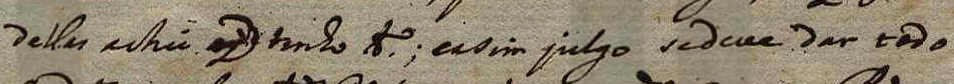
delles achei o q̄ tenho d̄.o; e assim julgo se deve dar todo
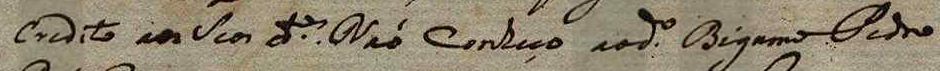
Credito aos Seos d̄.os. Naõ Conheço ao d.o Bigamo Pedro
